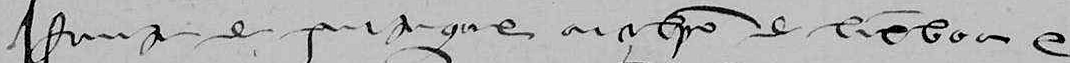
Jfante de purtugal arcebp̄o de lixboa e
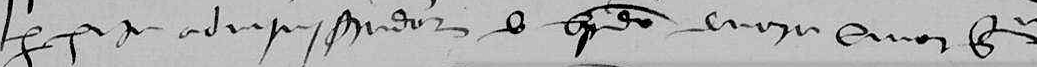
ꝑpetu admjnjstrador do bp̄do deuora e moestro
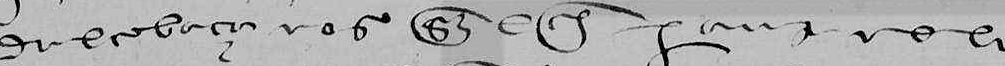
dalcobaça noso s̄or e c̄ꝭ ꝑante elle
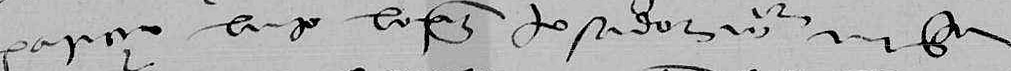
pareceo bento lopez tosador mor nesta
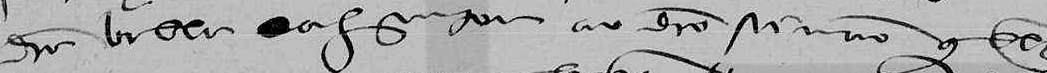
dīa villa e aꝑsentou ao dīo simão gl̄lz
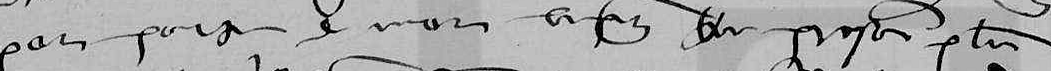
por parte de mor lopē Ree presa plā
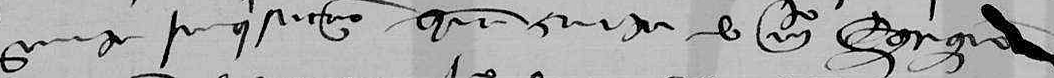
santa Jnqisição huā carta do mto Egregio
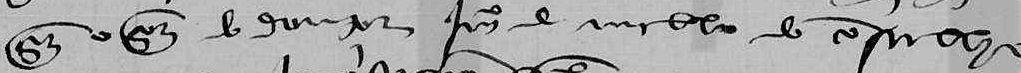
s̄or o s̄or do doutor Jmo de mello do c̄oselho
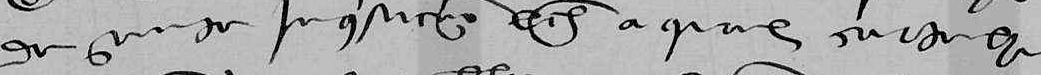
da santa Jnqisição e c̄ꝭ a qual carta he
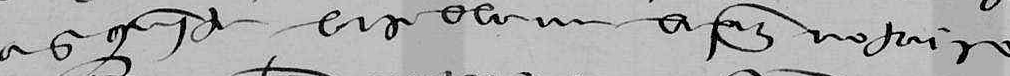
a segj̄te bertollameu lopez notairo
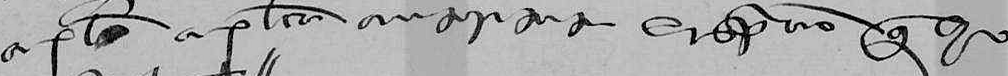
apl̄o apl̄ca autoritate e esꝑuão q̄ ho
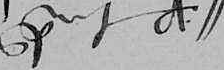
esp̄uj
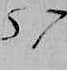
57
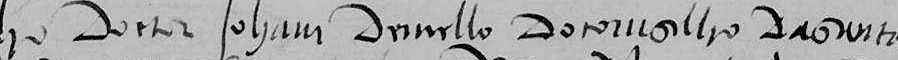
ho Doctor Joham De mello Do comselho da santa
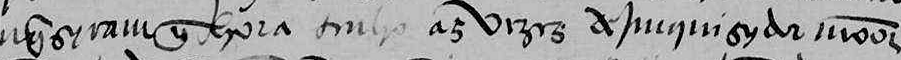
Jnq̄syçam q̄ hora tenho as vezes de Jmquisydor mōor
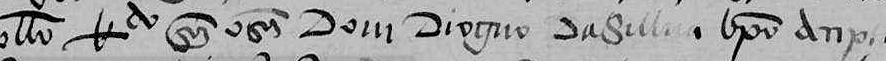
p̄llo Rdo s̄or o s̄or Dom Dioguo da Sillua bp̄o de cepta
